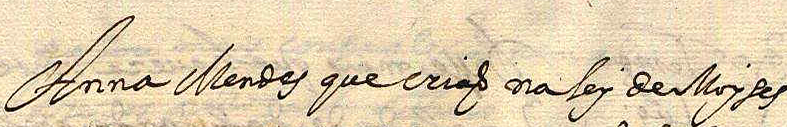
Anna Mendes que criaõ na ley de Moyses
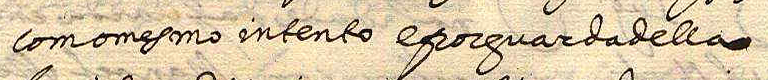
com o mesmo intento e por guarda della
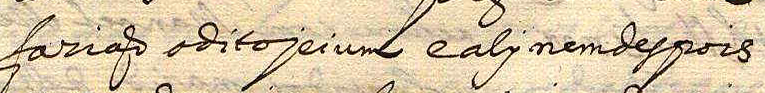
faziaõ o dito jejum, e aly nem despois
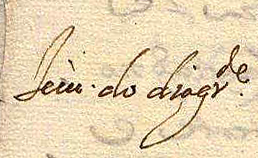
Ieiū do dia gr.de
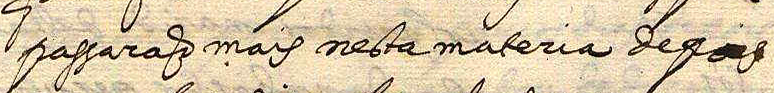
passaraõ mais nesta materia depois
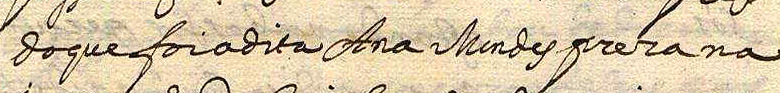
do que foi a dita Ana Mendes preza na
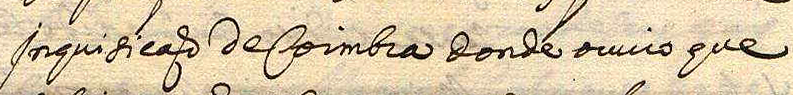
Jnquisiçaõ de Coimbra donde ouuio que
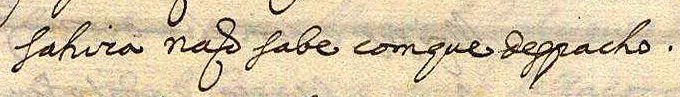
sahira naõ sabe com que despacho.
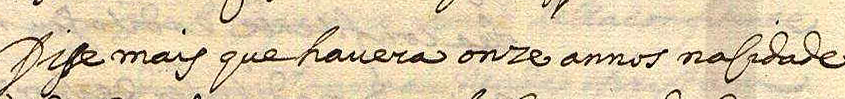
Disse mais que hauera onze annos na Cidade
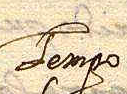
Tempo
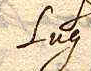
Lug
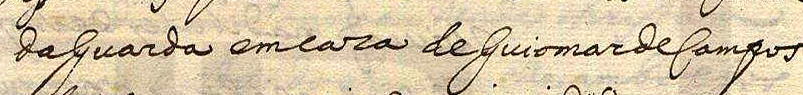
da Guarda em caza de Guiomar de Campos
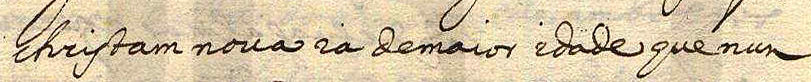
christam noua ia de maior idade que nun
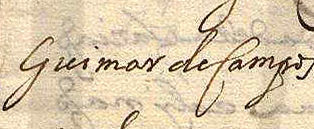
Guimar de Campos
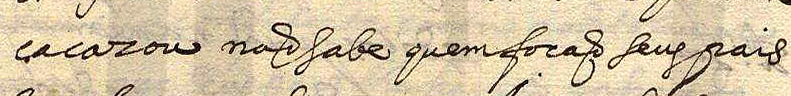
ca cazou naõ sabe quem foraõ seus pais
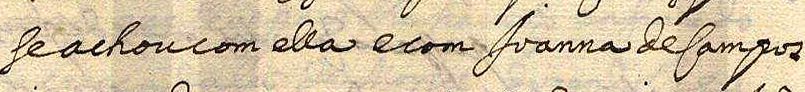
se achou com ella e com Joanna de Campos
